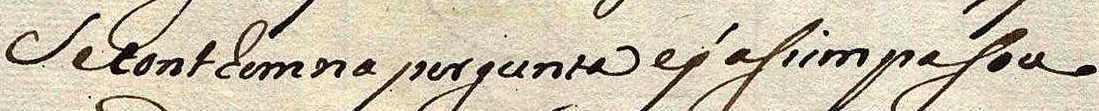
Se conthem na pergunta, e q̄ assim pasou
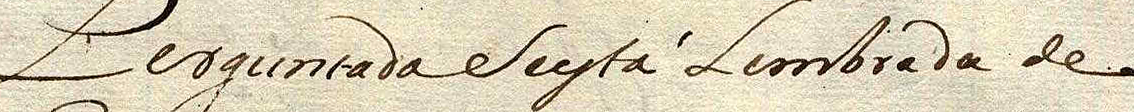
Perguntada Se está Lembrada de
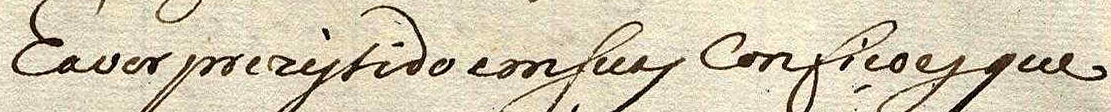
haver prezistido em suas Confiçoes que
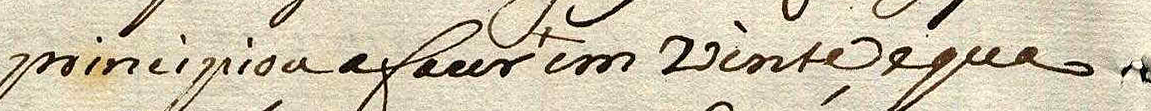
principiou a fazer em vinte, e qua
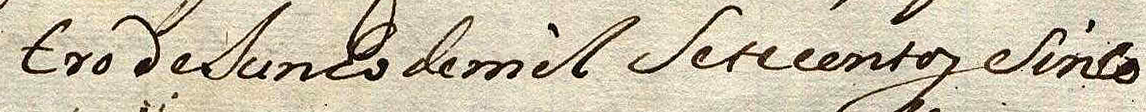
tro de Iunho de mil Setecentos Sinco
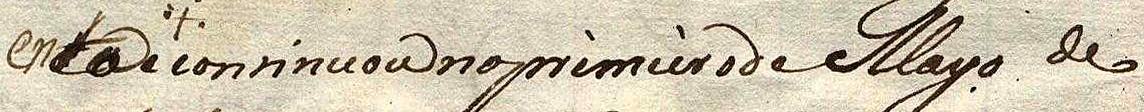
enta e continuou no primeiro de Mayo de
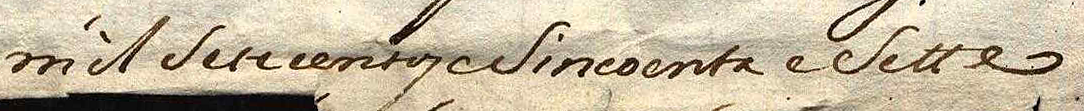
mil Setecentos e Sincoenta e Sette
